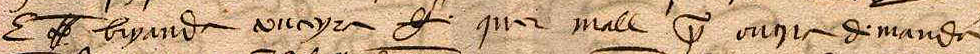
E c̄o bryanda couceyra lhe quer mall p̄o outra demanda
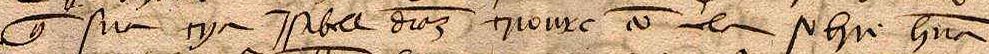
q̄ sua tya Jsabell diaz trouxe c̄o ela sobre h̄ua
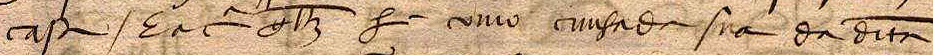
casa / E a ca ḡllz he como cunhada sua da dita
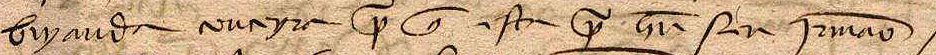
bryanda couceyra p̄o q̄ esta p̄o h̄u seu Jrmão /
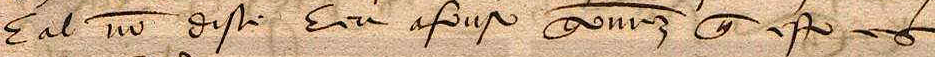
E al n̄o dise E eu afonso gomez q̄ esto es
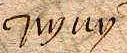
cryuy
